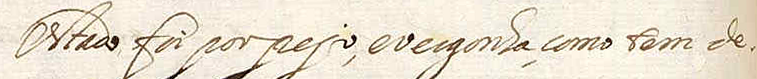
estado foi por pejo, e vergonha, como tem de
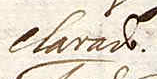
clarado.
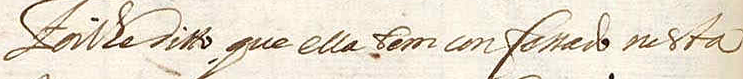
Foi lhe ditto, que ella tem confessado nesta
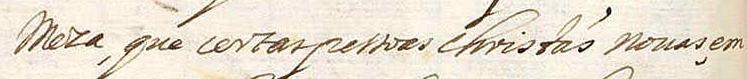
Meza, que certas pessoas christãs nouas, em
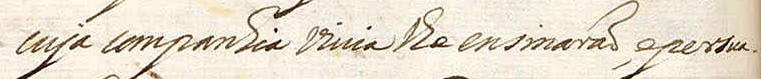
cuja companhia viuia lhe ensinaraõ, e persua
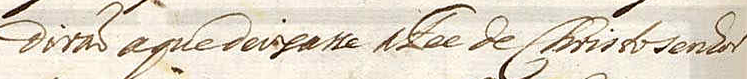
diraõ a que deixasse a Fee de Christo senhor
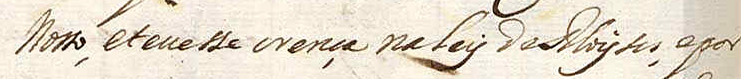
Nosso, e teuesse crença na Ley de Moyses, e por
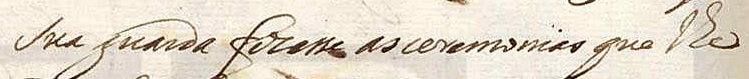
sua guarda fizesse as ceremonias que lhe
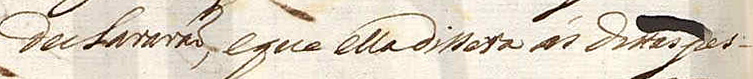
declararaõ, e que ella dissera ás dittas pes
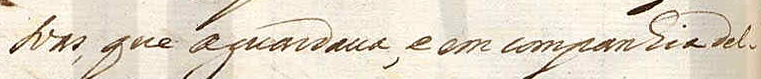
soas, que a guardaua, e em companhia del
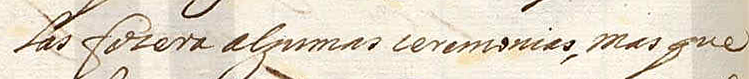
las fezera algumas ceremonias, mas que
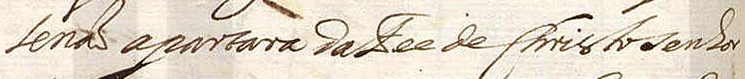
se naõ apartara da Fee de Christo senhor
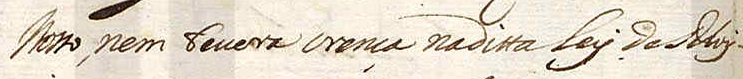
Nosso, nem teuera crença na ditta Ley de Moy
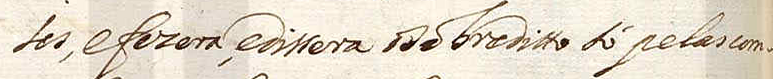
ses, e fezera, e dissera o sobreditto só pelas com
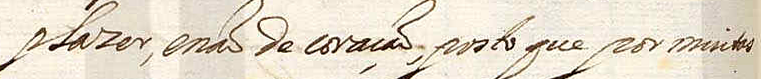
plazer, e naõ de coração, posto que por muitas
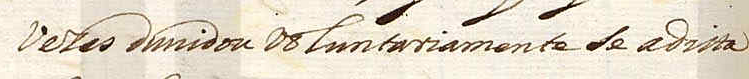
vezes duuidou voluntariamente se a ditta
